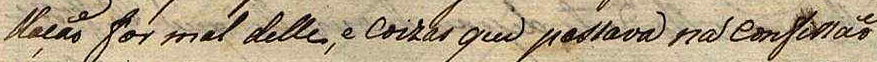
llaçaõ por mal delle, e coizas que passava na confissaõ
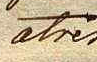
a tres
